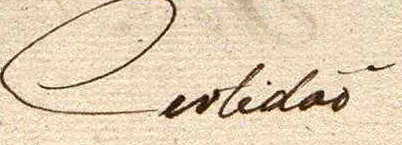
Certidaõ
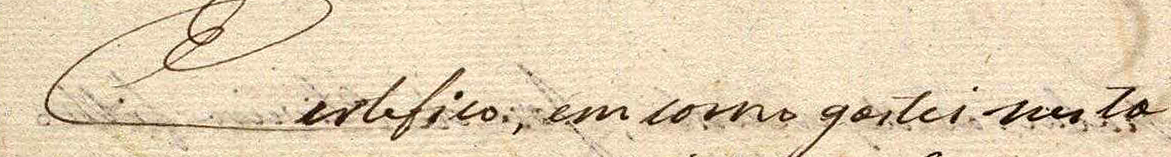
Certifico, em como gastei nesta
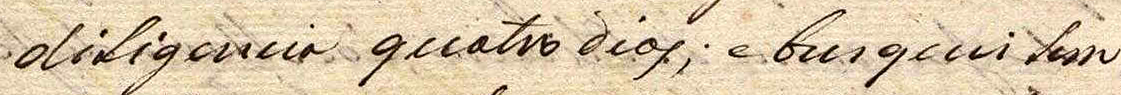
diligencia quatro dias; e busquei sem
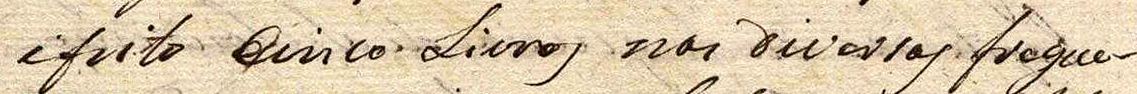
efeito cinco Livros nas diversas freque
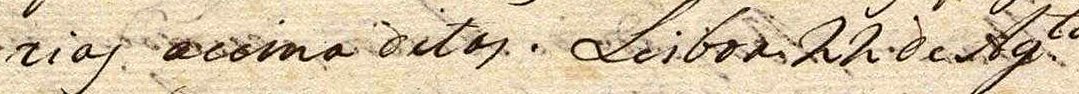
zias acima ditas. Lisboa 22 de Ag.to
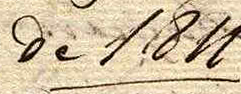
de 1811
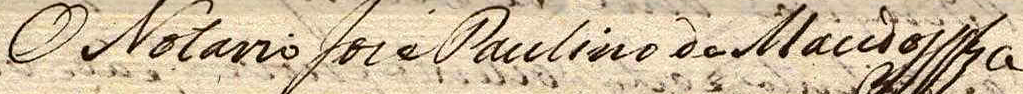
O Notario Joze Paulino de Macedo
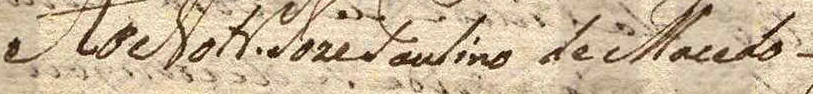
Ao Notr.o Ioze Paulino de Macedo
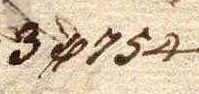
3$754
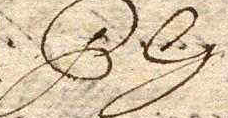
PG
